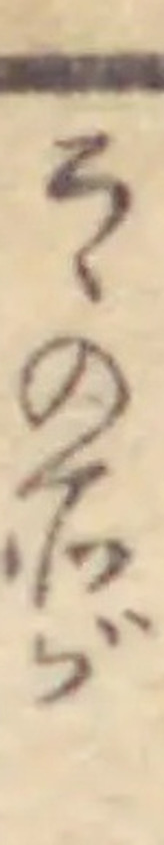こゝの所が
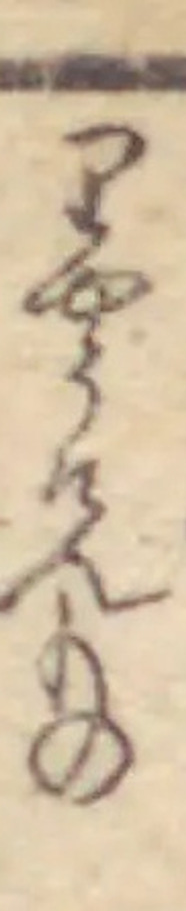りやうけんもの
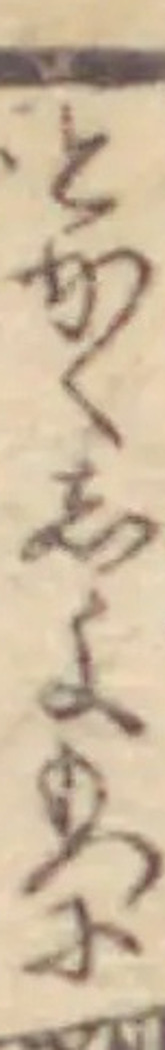とかくしよもつに
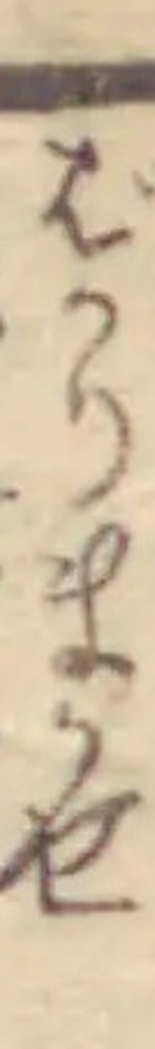ばかりまかせ
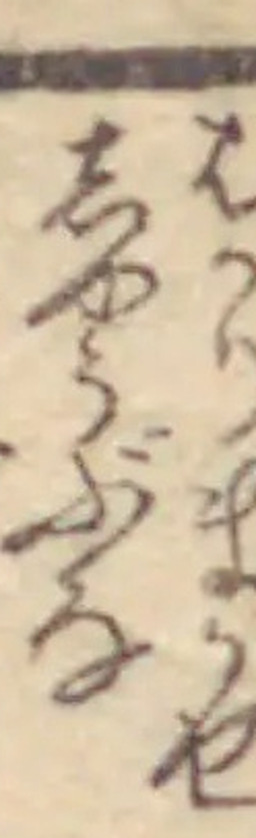しやうぶな
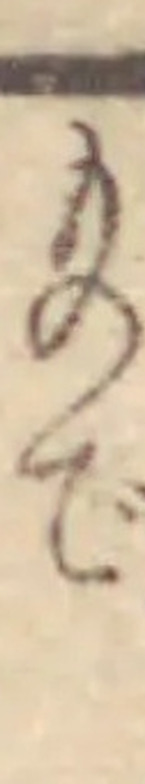もので
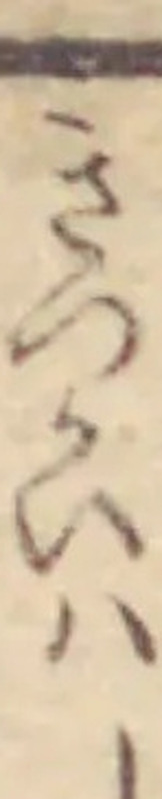きつかいは
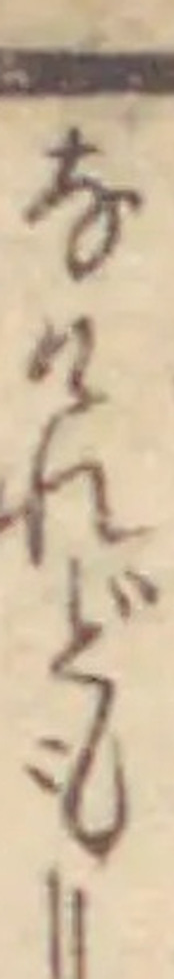なけれども
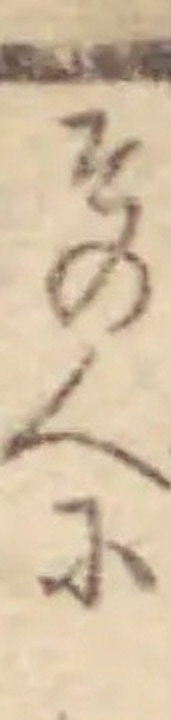その人に
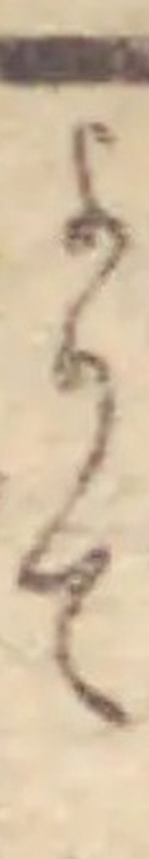よりて
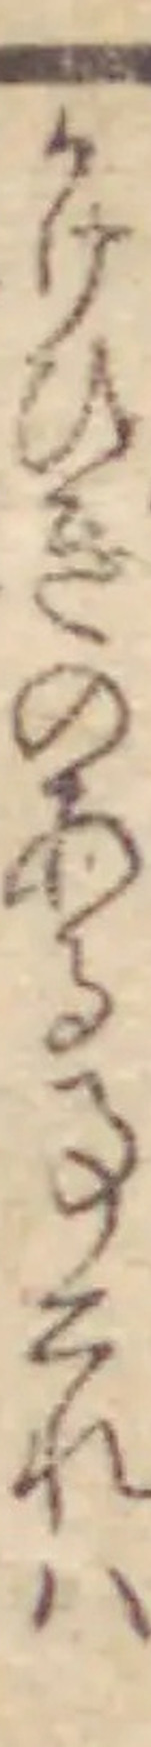かけひきのある事これは
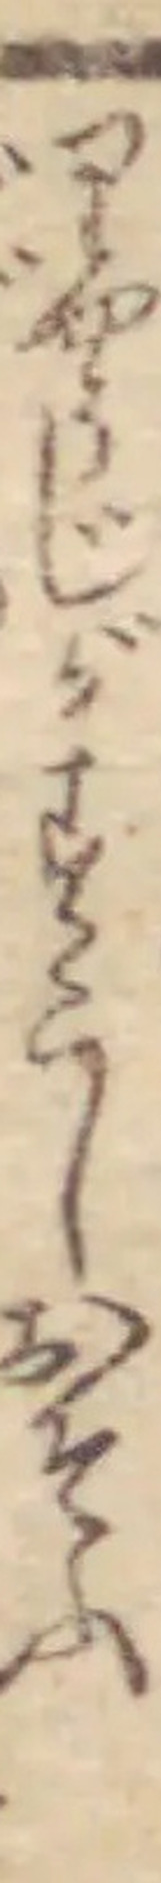りやうじがすこしおそふ
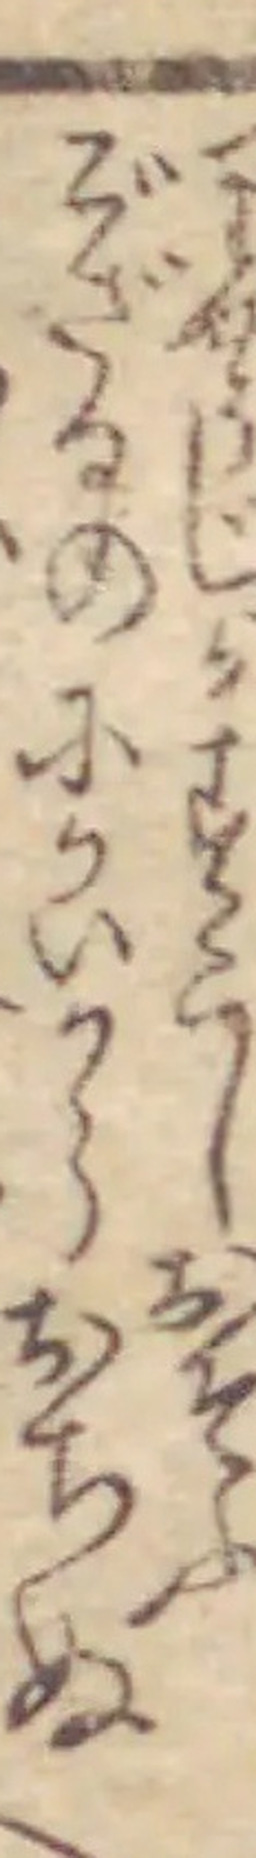ござるのにかいからおちぬ
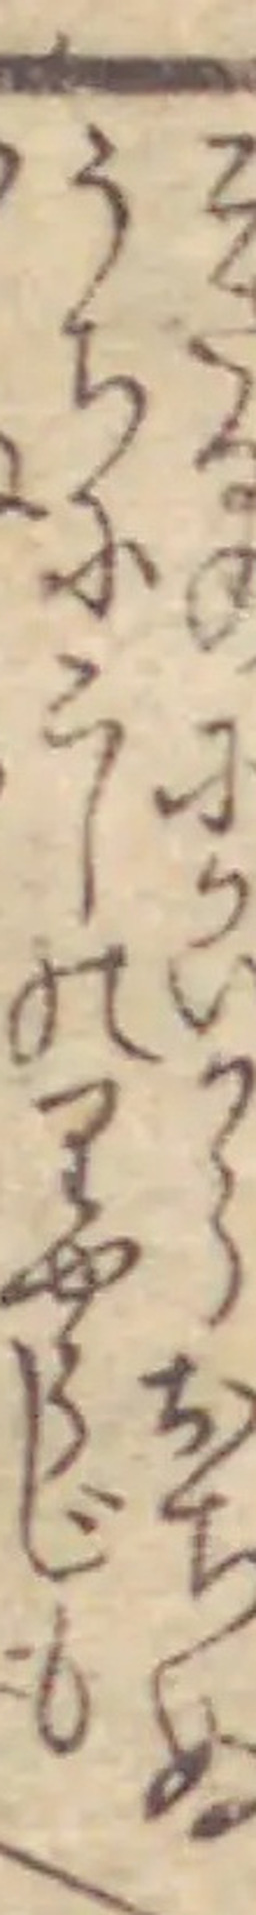うちにこしのりやうじも
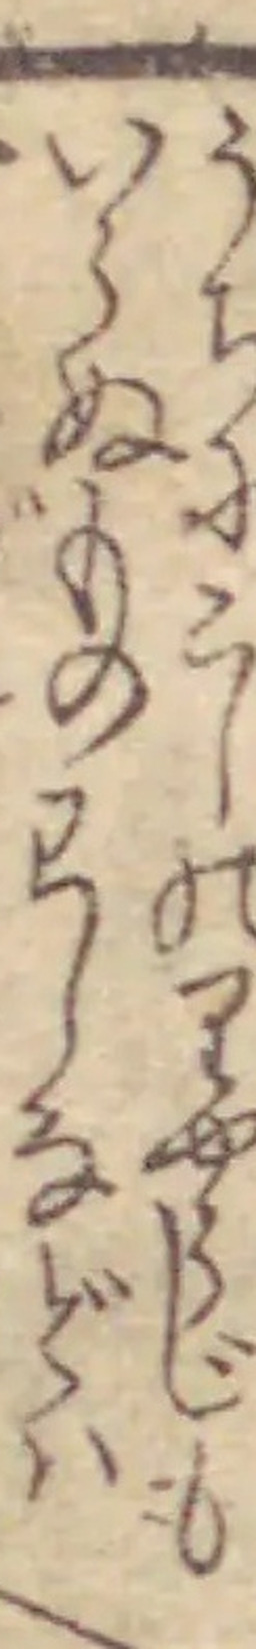いらぬものわしなどは
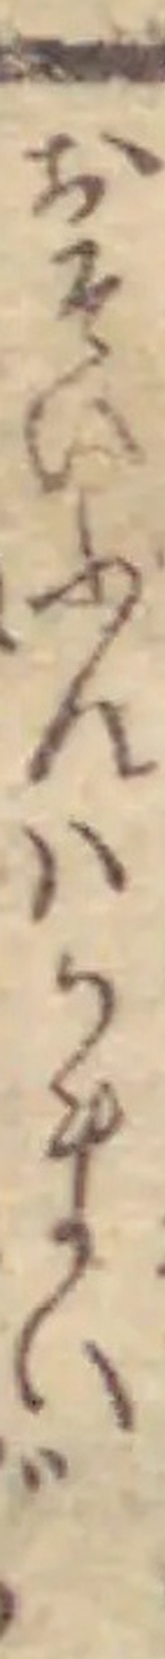おそいぶんはかまい
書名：家伝寿命薬 2巻
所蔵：国立国会図書館 National Diet Library, JAPAN
